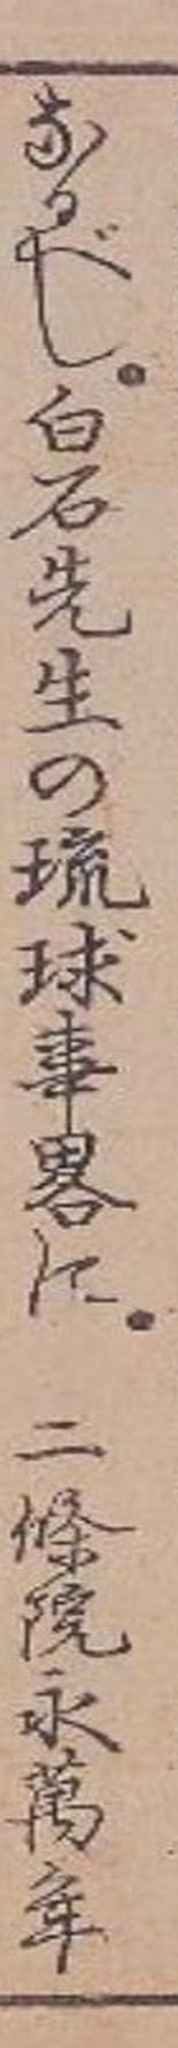なるべし•白石先生の琉球事略に•二條院永万年
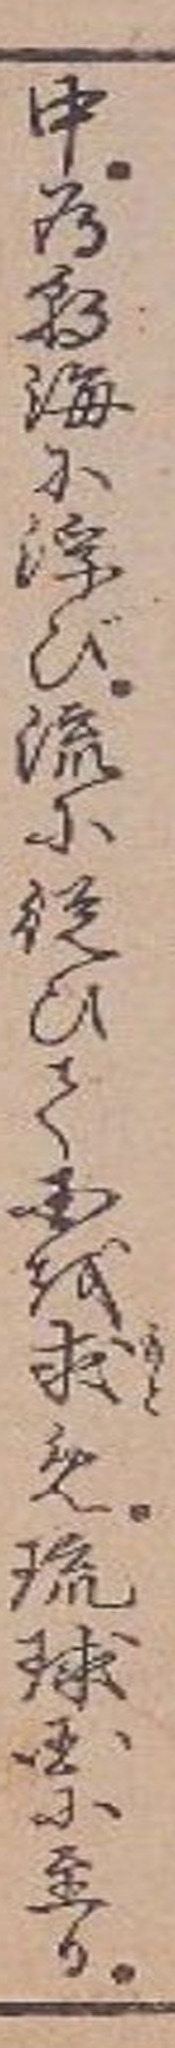中•為朝海に浮び•流に従ひて国を求め•琉球国に至り•
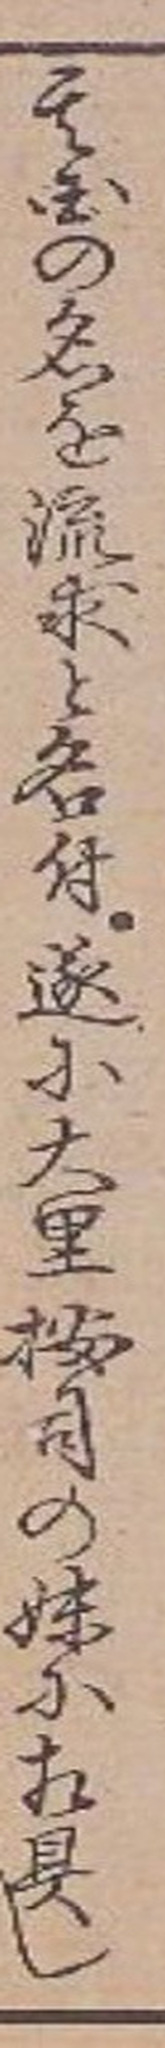其国の名を琉求と名付•遂に大里按司の妹に相具し
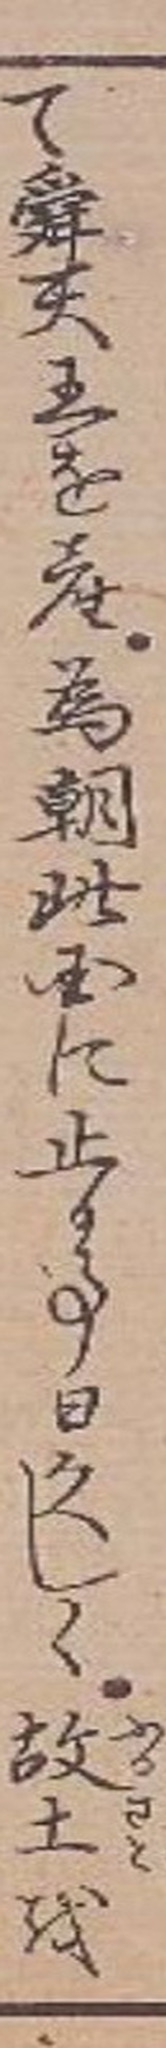て舜天王を産•為朝此国に止る事日久しく•故土を
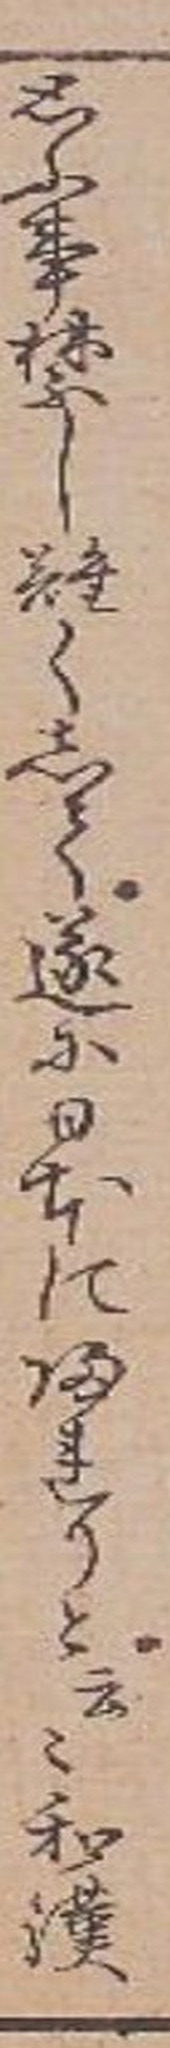思ふ事禁し難くして•遂に日本に帰れりと•云々和漢
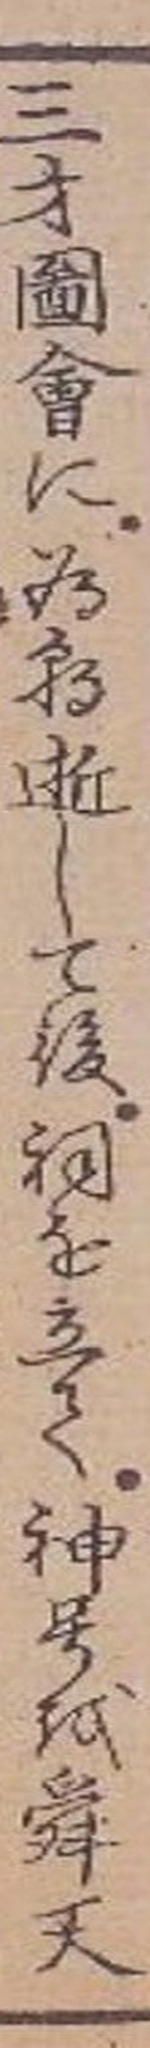三才図会に•為朝逝して後•祠を立て•神号を舜天
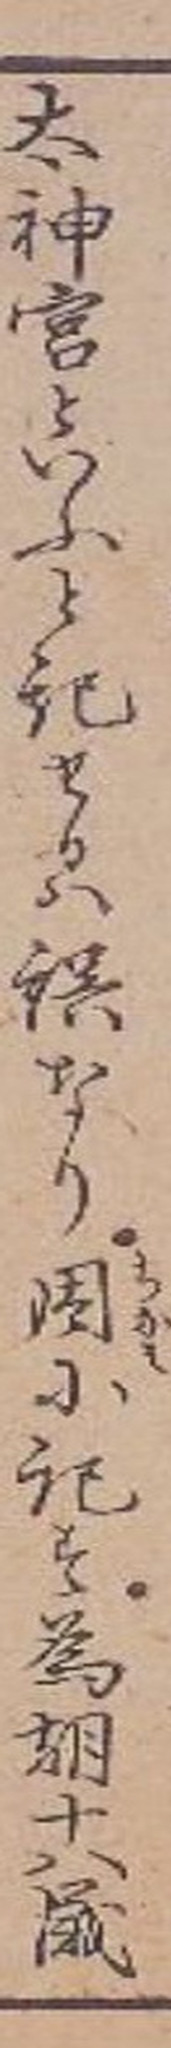太神宮といふと記せるは誤なり•因に記す•為朝十六歳
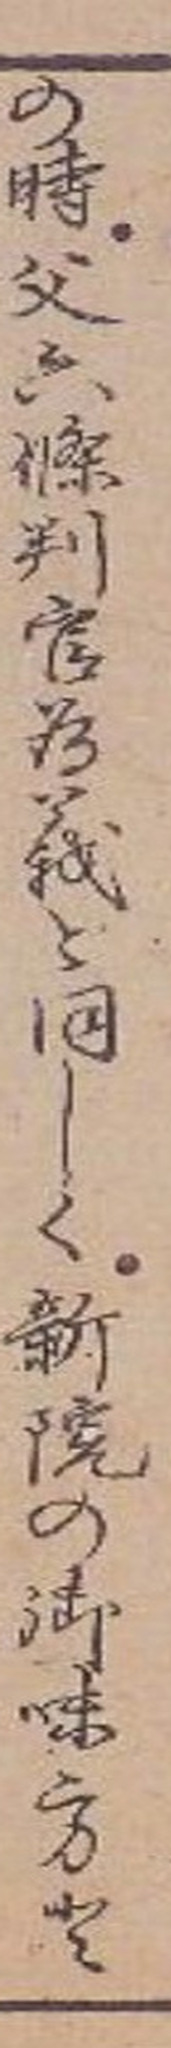の時•父六條判官為義と同しく•新院の御味方と
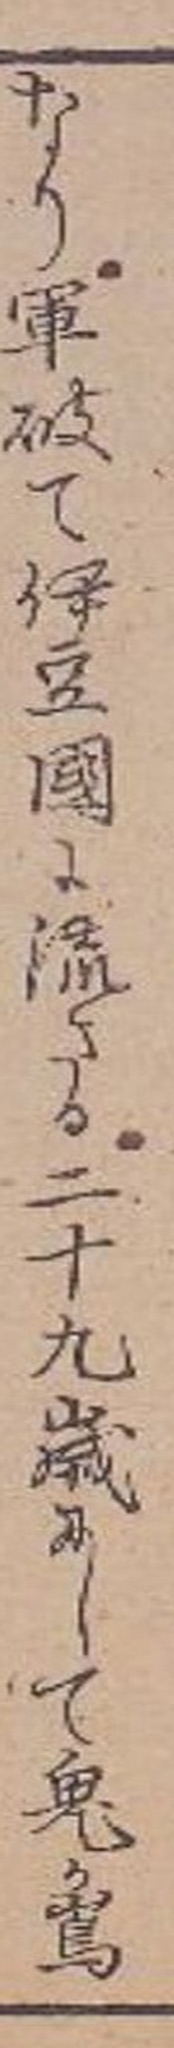なり•軍破て伊豆国に流さる•二十九歳にして鬼か島
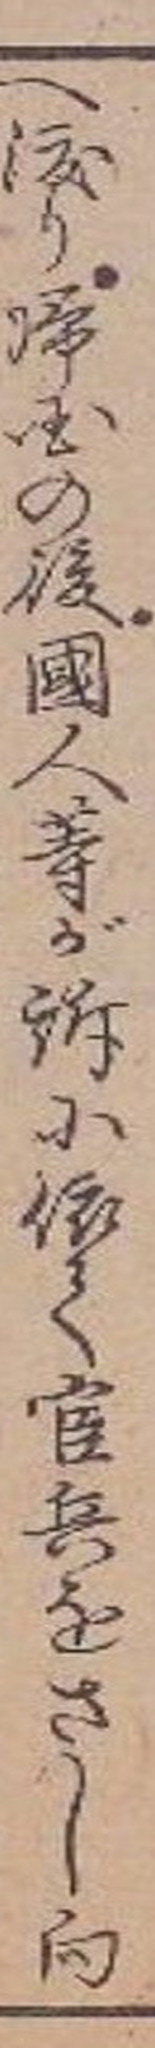へ渡り•帰国の後•国人が訴に依て官兵をさし向
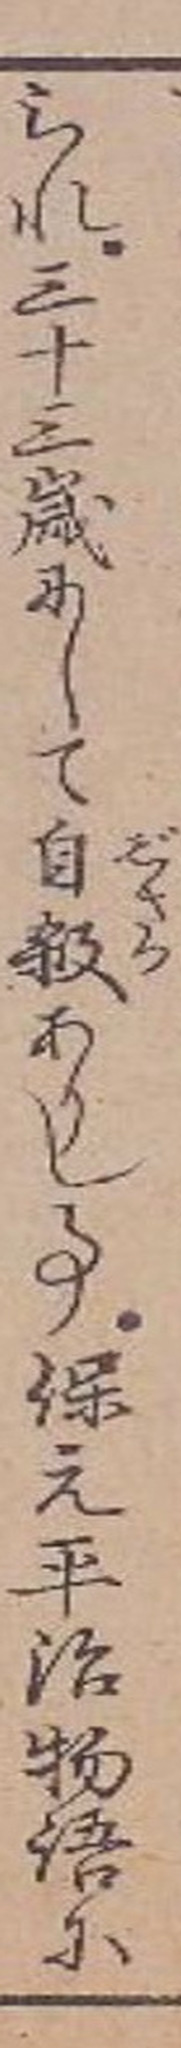られ•三十三歳にして自殺ありし事•保元平治物語に
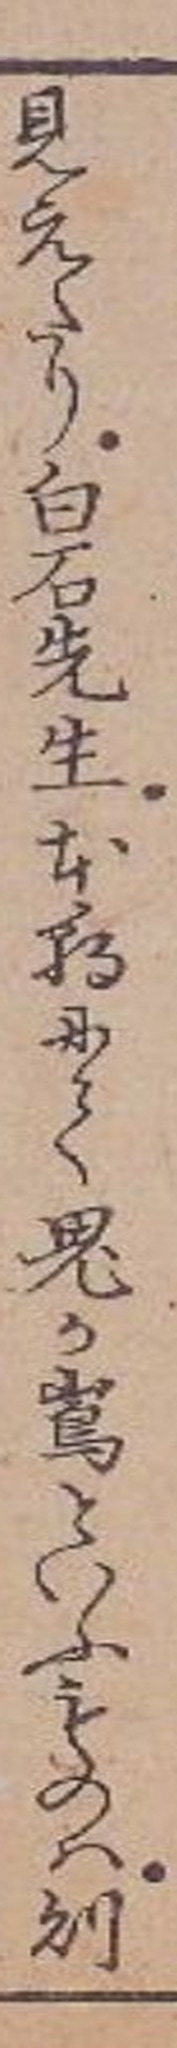見えたり•白石先生•本朝にて鬼か島といふものは•則
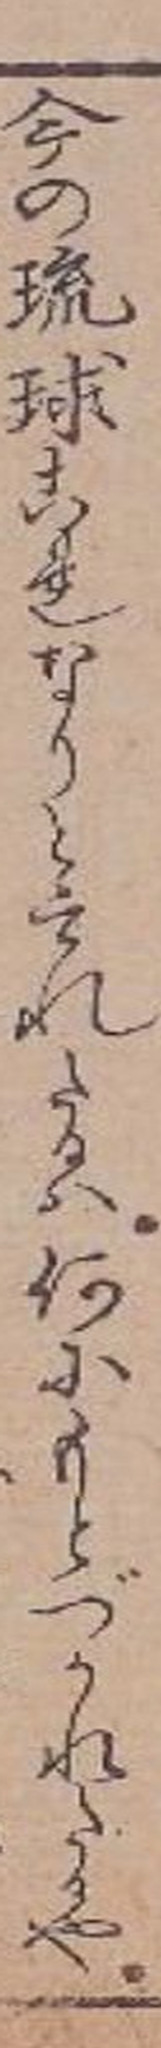今の琉球これなりと云れたるは•何にもとづかれたるや•
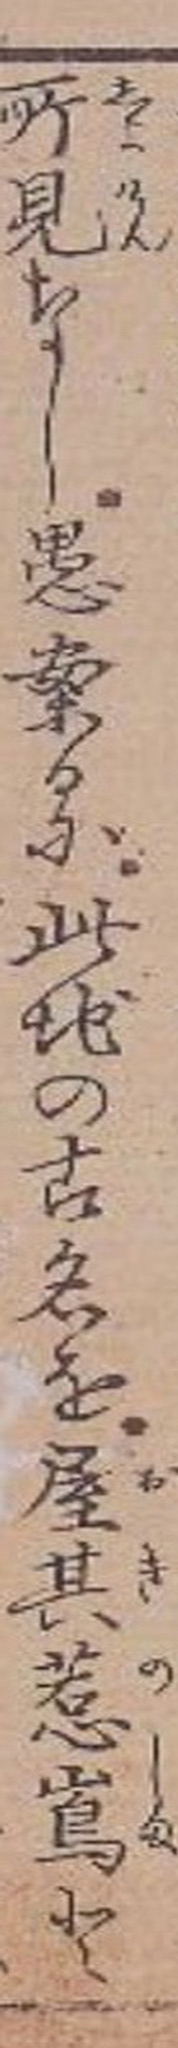所見なし•愚案るに•此地の古名を•屋其惹島と
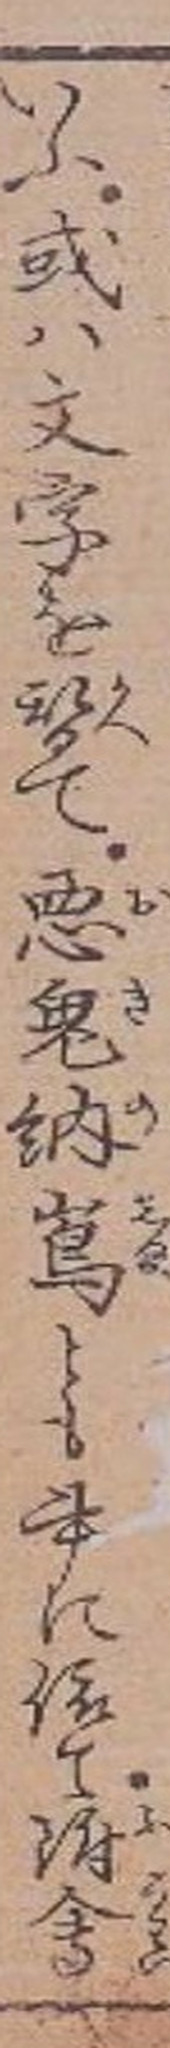いふ•或は文字を替て•悪鬼納島とも書に依て•附会

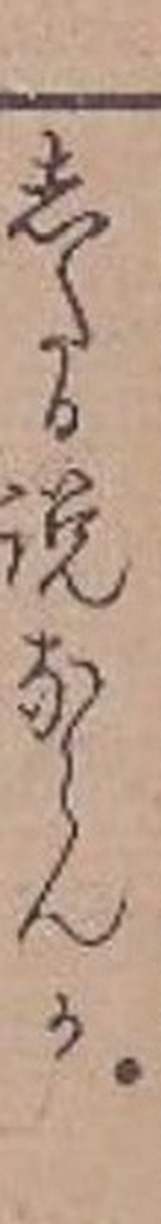したる説ならんか•
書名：琉球談
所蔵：University of the Ryukyus Library
